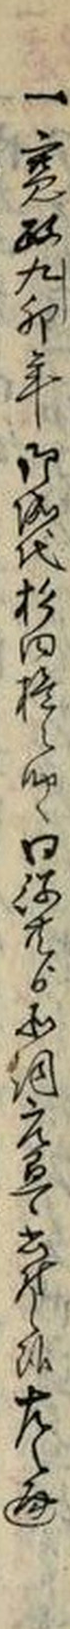一寛政九卯年御城代杉田権之助へ同役共ゟ取調取置候書付之趣左之通
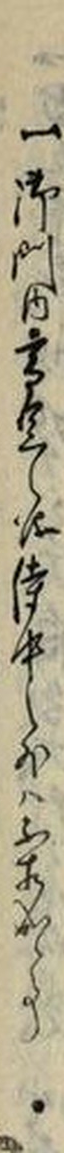一御門内高足之儀侍中之外は不相成候事
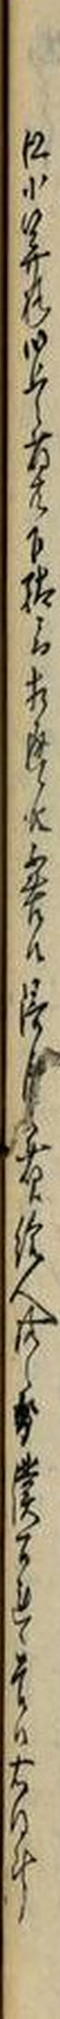但小算格以上之者共下駄に而相通候儀不苦候給人格之外僕召連候節は右同断
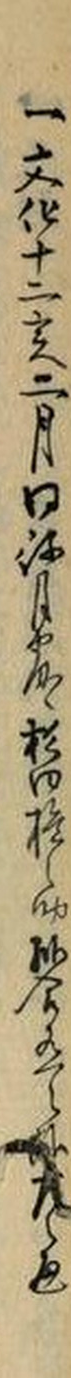一文化十二亥二月同役月番へ杉田権之助掛合有之候趣左之通
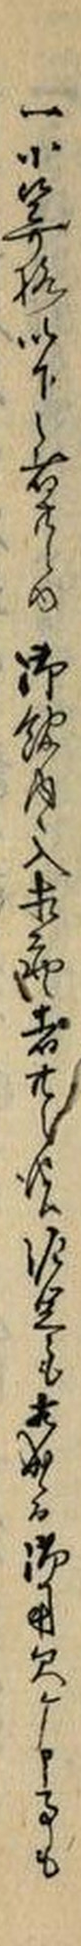一小算格以下之者共之内御館内へ入相勤候者共之儀は泥足にも相成候而御用欠け申事も
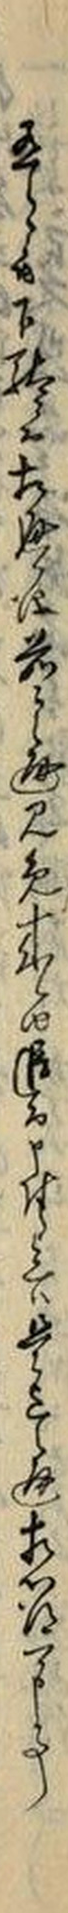有之候に付下駄に而相通候儀前々之通見免来候由追而申付候迄は是迄之通相心得可申事
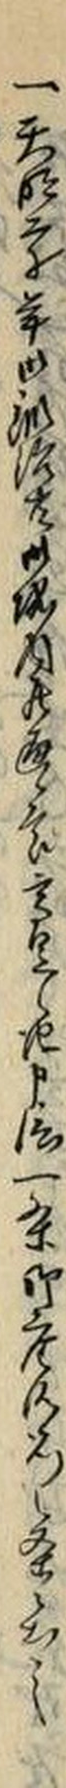一天明二寅年御鍛冶共御城内罷通候節高足之儀申渡一条御座所御門之条に出之
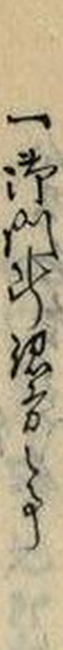一御門断認方之事
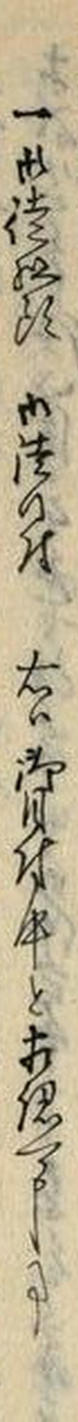一御徒組頭御徒目付右は御目付中と相認可申候事
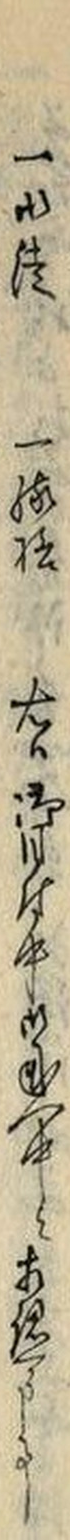一御徒一統格右は御目付中御用人中と相認可申事
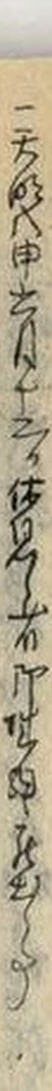一天明八申六月十二日休息之者御城内へ罷出候事
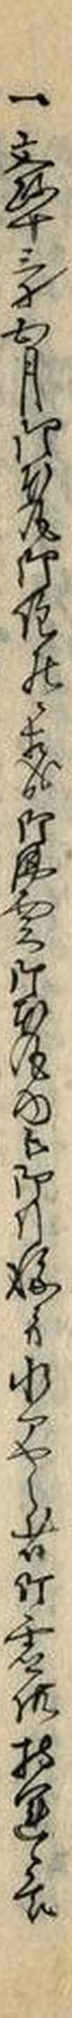一文政十三寅五月御本丸御住居に相成御仏殿御本丸内江御引移に付水部や之者共御霊供持運候節
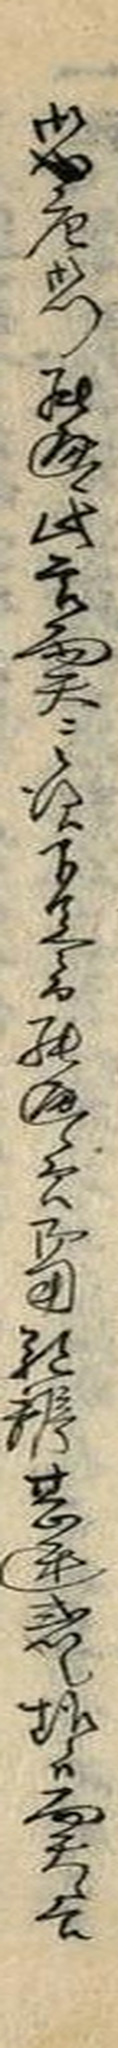御唐御門罷通候此節雨天に候得は下足に而罷通候而は御用難弁甚迷惑之趣に付雨天之節
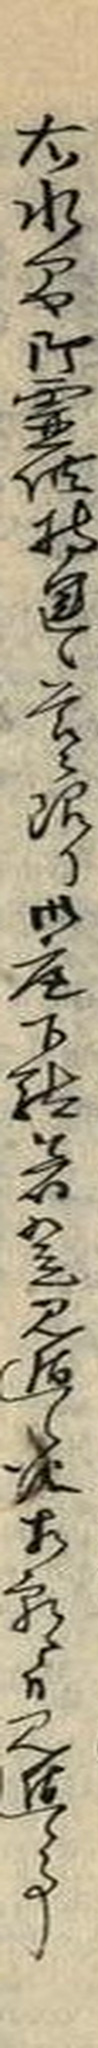右水部や御霊供持運候節に限り御庭下駄着笠見遁候儀相願候に付見遁候事
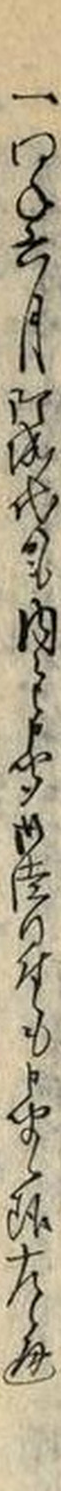一同年六月御城代ゟも内々被申聞御徒目付へも申聞候趣左之通
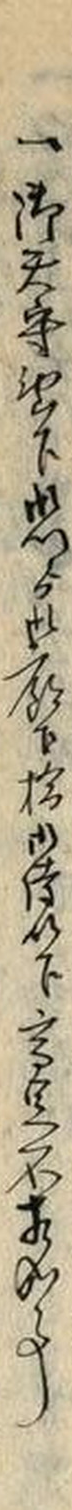一天守台下御門ゟ廊下橋御侍以下高足不相成事
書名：御門御櫓之部
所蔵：福井県文書館 Fukui Prefectural Archives
